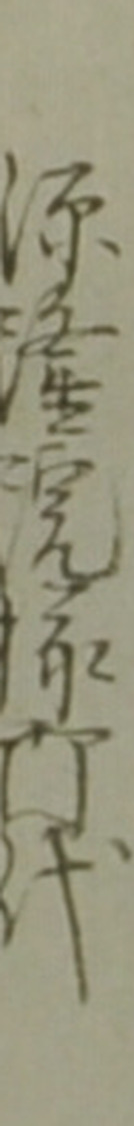源隆院様御代
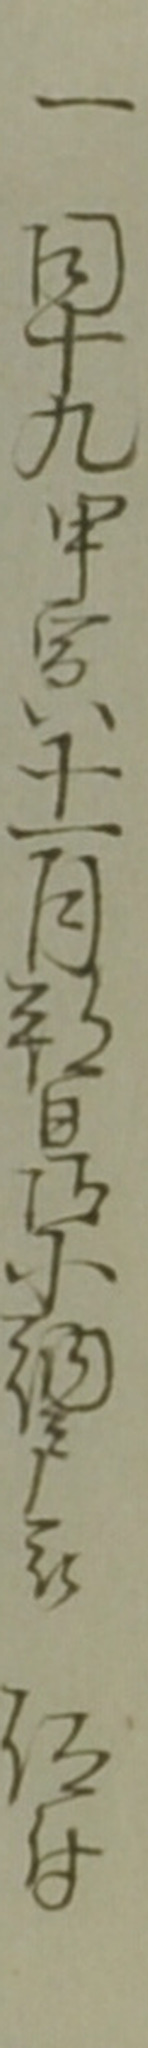一同十九甲寅十一月朔日御小納戸被仰付
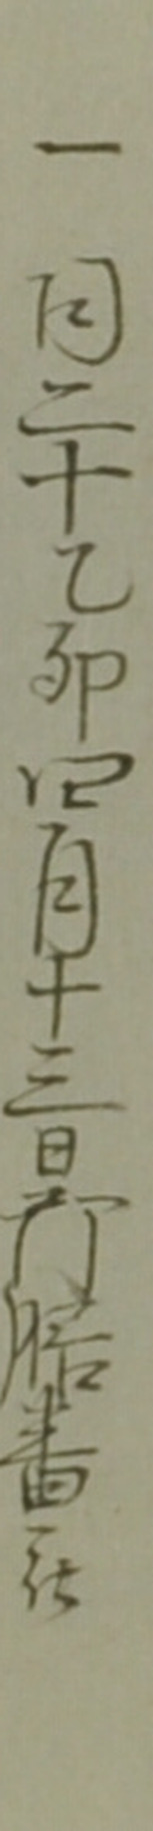一同二十乙卯四月十三日御膳番被
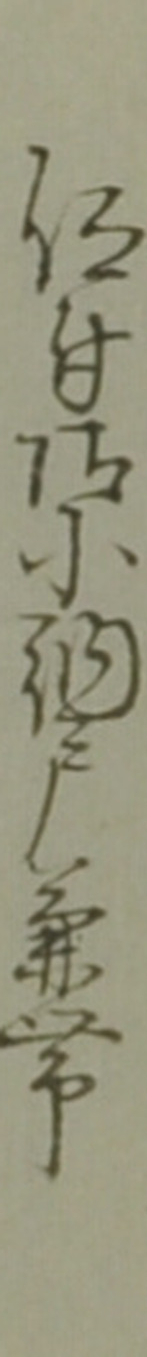仰付御小納戸兼帯
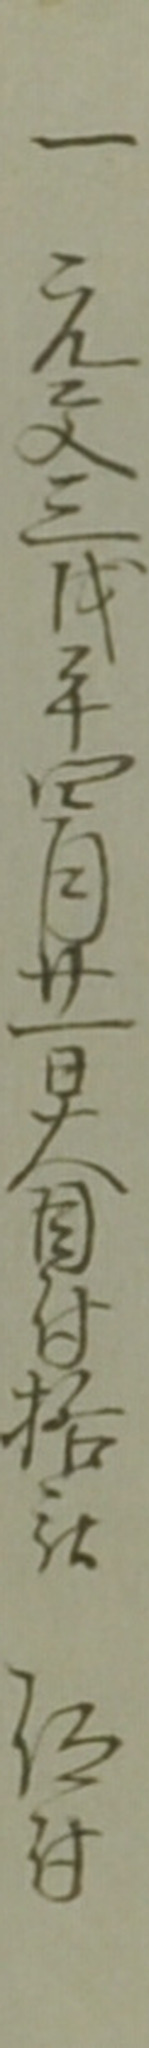一元文三戊午四月廿一日大目付格被仰付
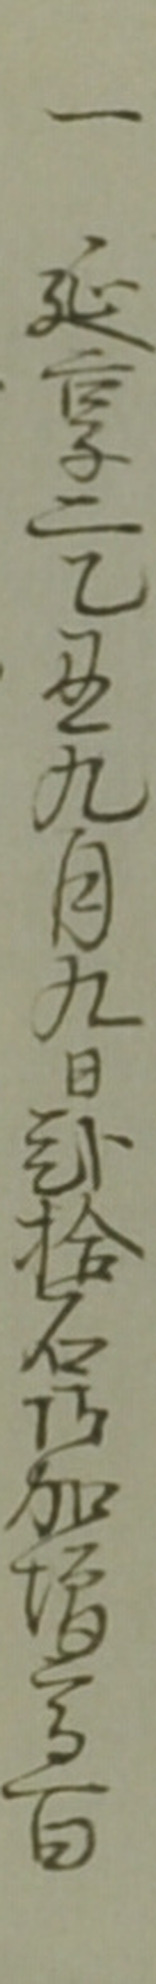一延享二乙丑九月九日弐拾石御加増高百
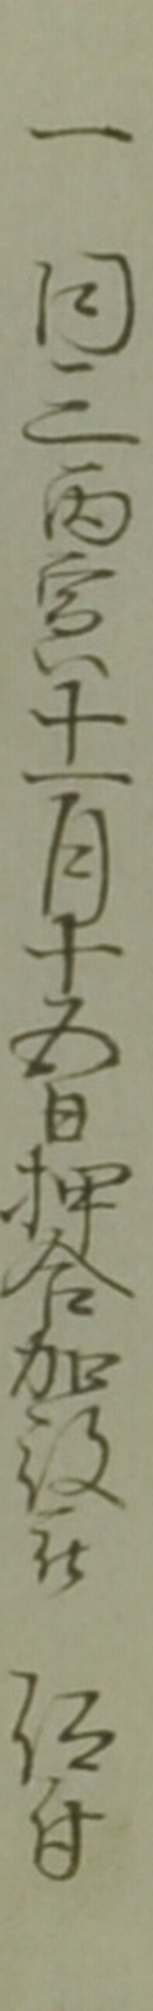一同三丙寅十一月十五日押合加役被仰付
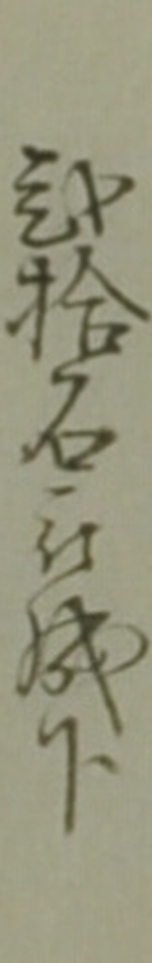弐拾石被成下
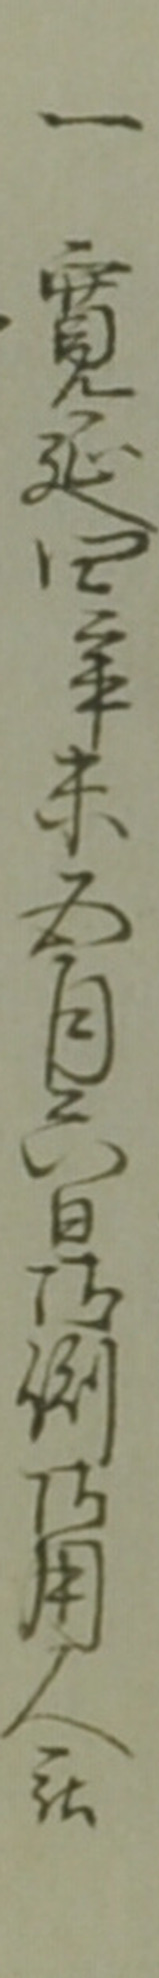一寛延四辛未五月六日御側御用人被
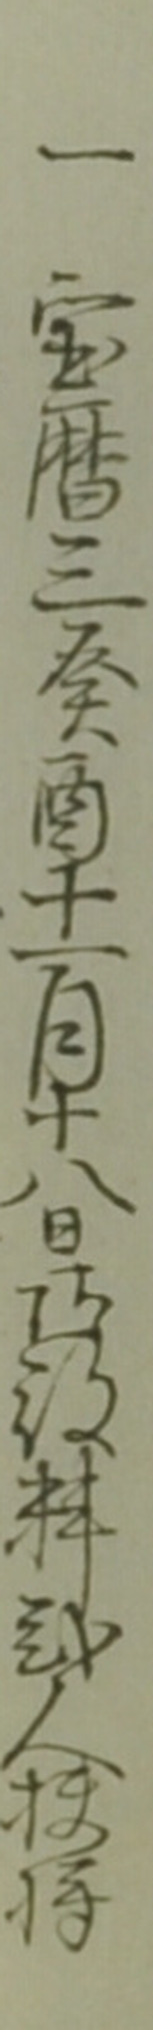一宝暦三癸酉十一月十八日御役料弐人扶持
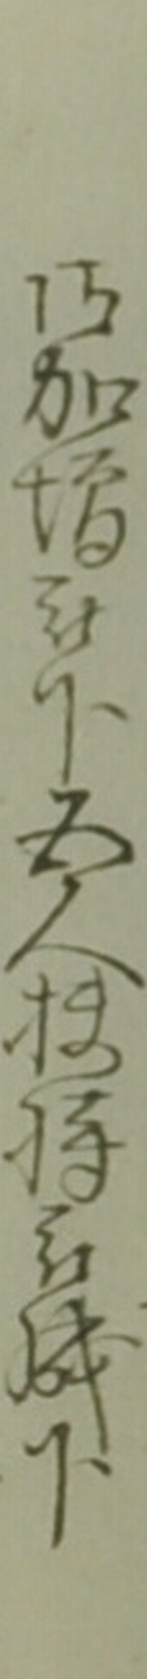御加増被下五人扶持被成下
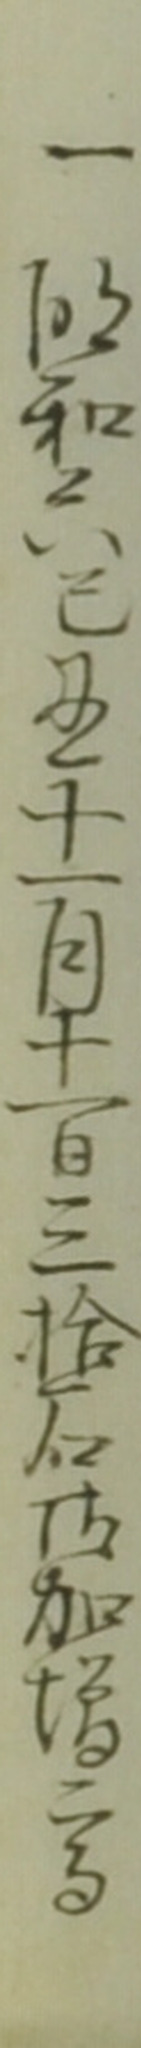一明和六己丑十一月十一日三拾石御加増高

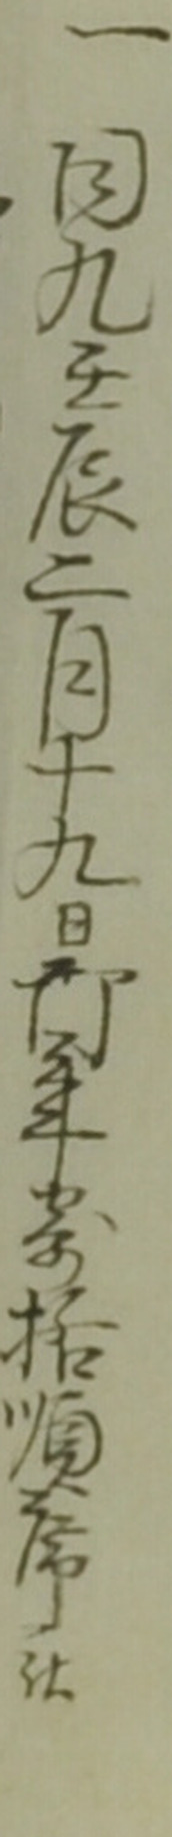一同九壬辰ニ月十九日御年寄格順席被
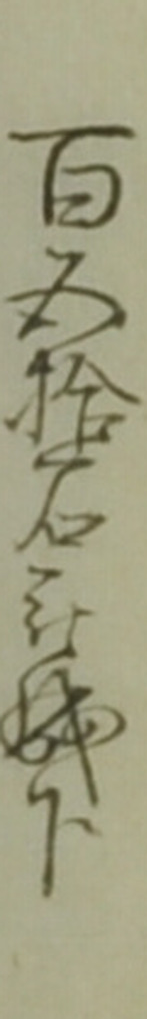百五拾石被成下
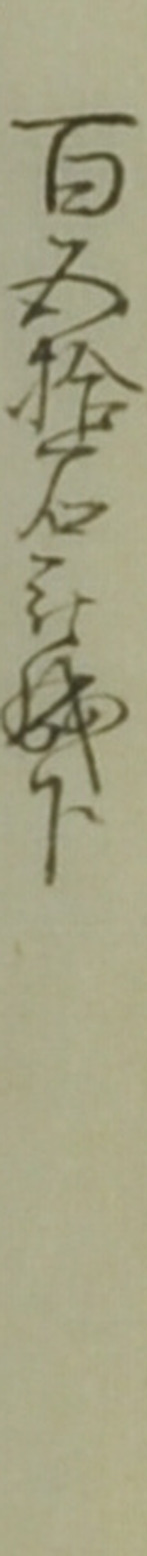百五拾石被成下
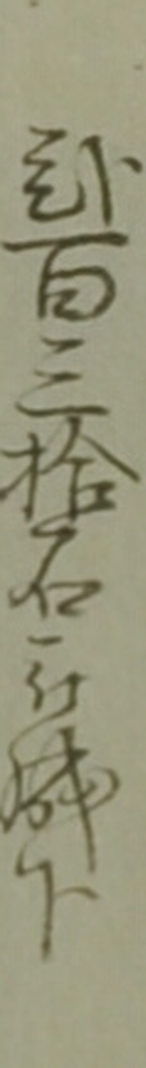弐百三拾石被成下
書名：給人諸士勤仕録（三）
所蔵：伊那市立高遠町図書館・合同会社AMANE
